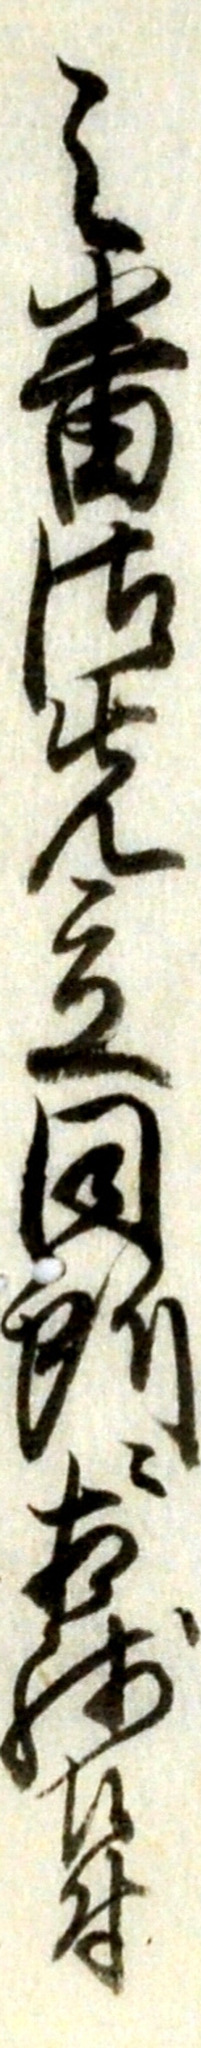之番御先立同所ニ相残候付
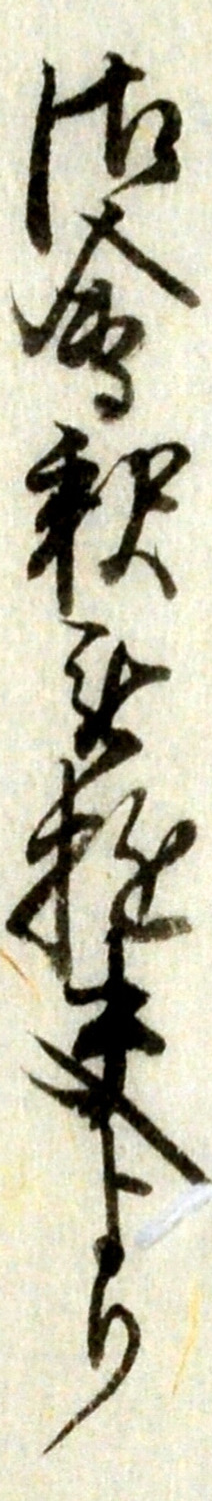御会釈被遊夫より
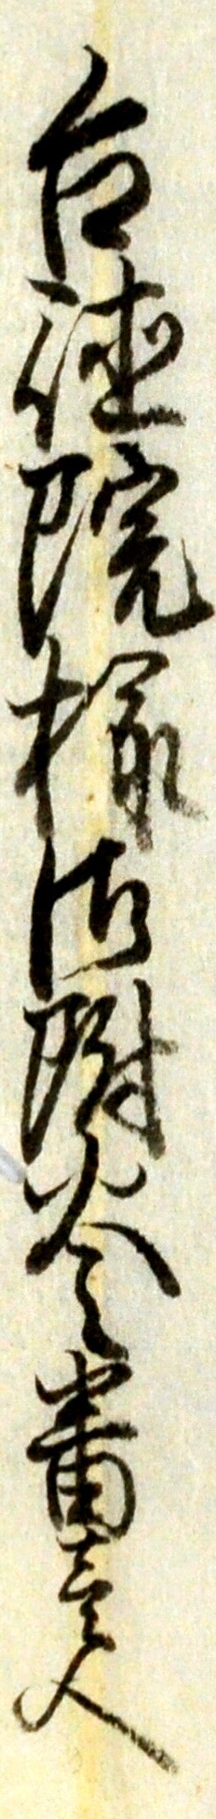台徳院様御附火之番壱人
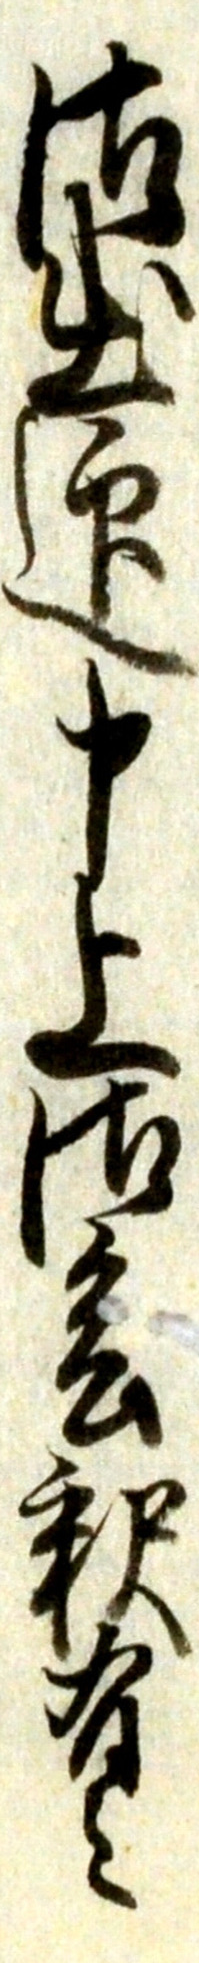御出迎申上御会釈有之
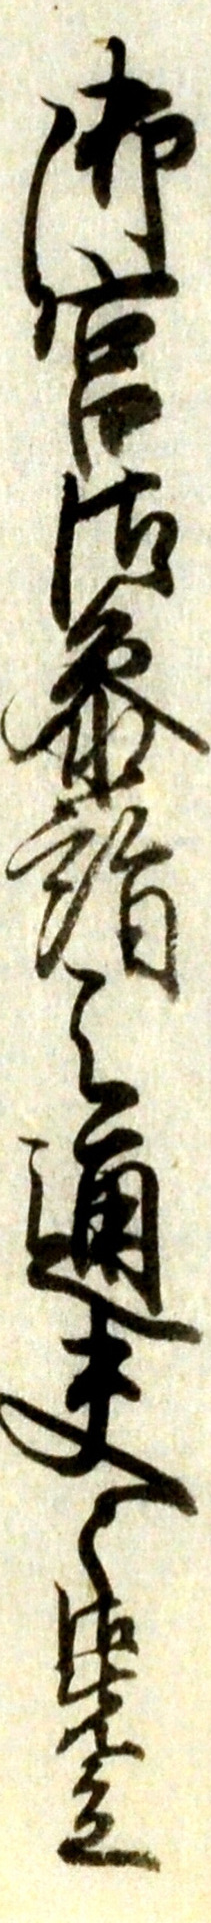御宮御参詣之通夫ゟ御先
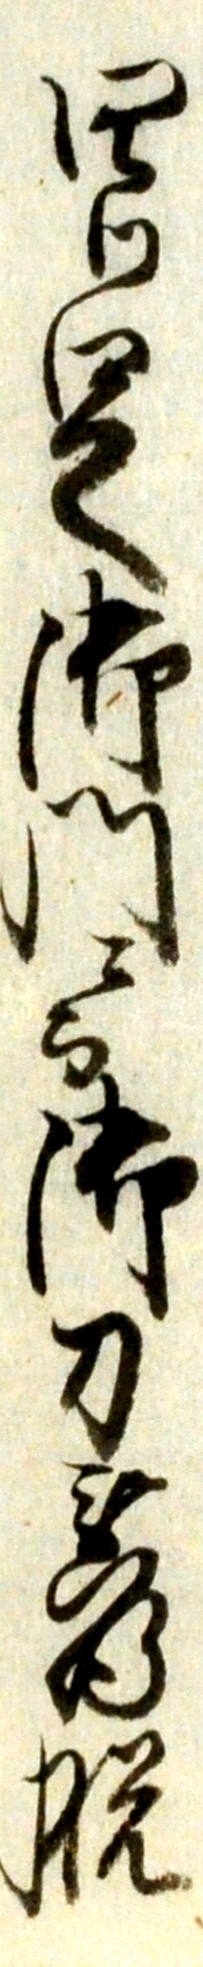四ツ足御門ニ而御刀被為脱
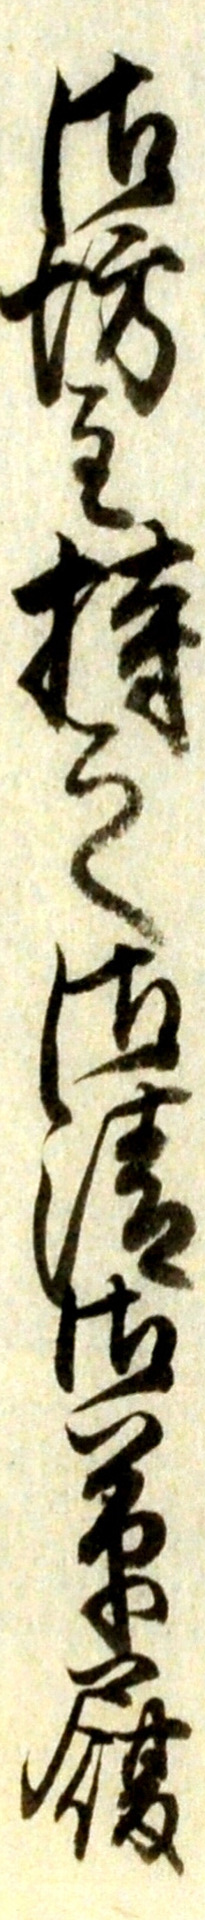御坊主持之御清御草履
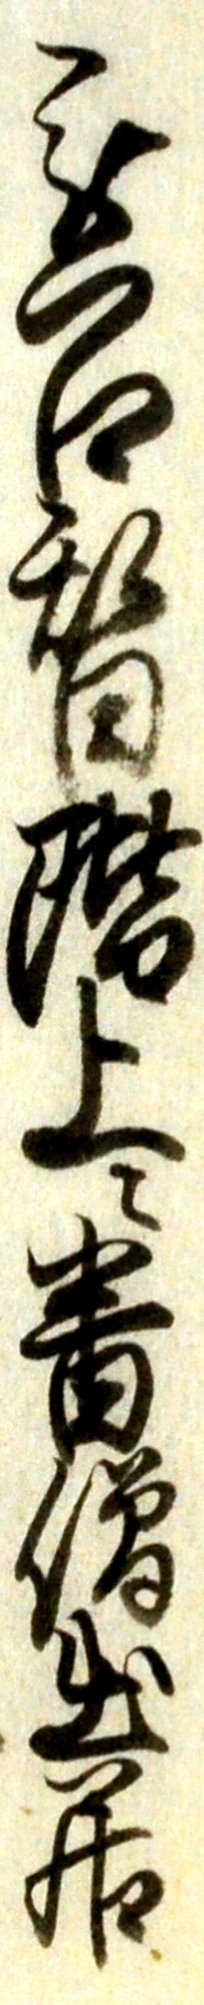被召替階上ニ番僧出居
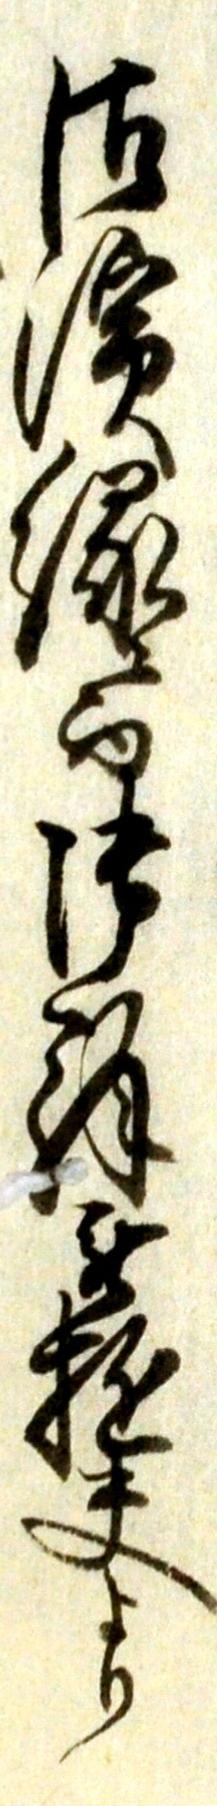御演縁ニ而御拝被遊夫より
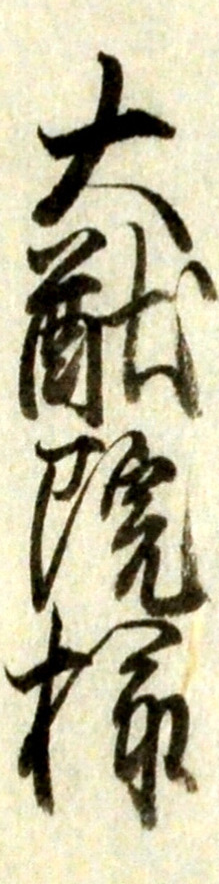大猷院様
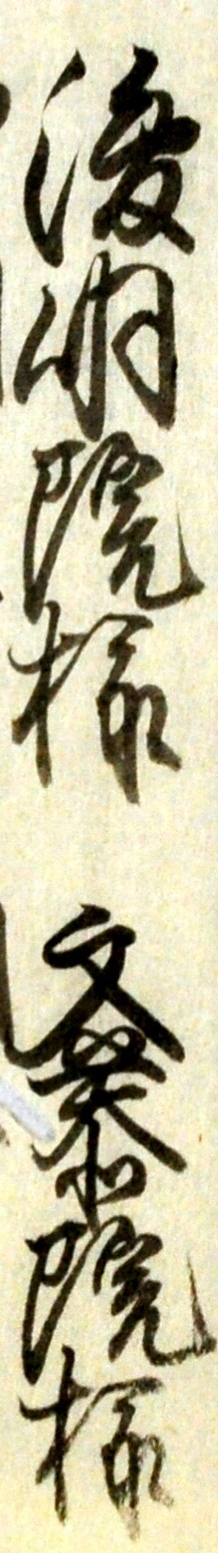浚明院様文恭院様
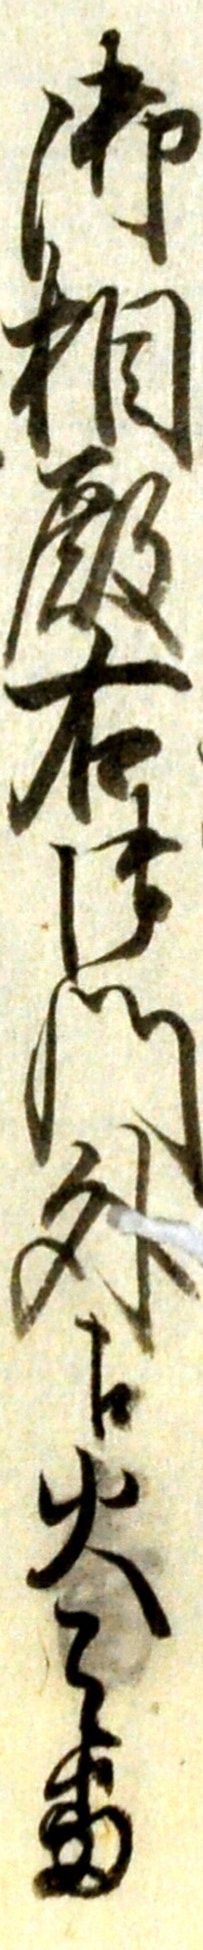御相殿右御門外え火之番
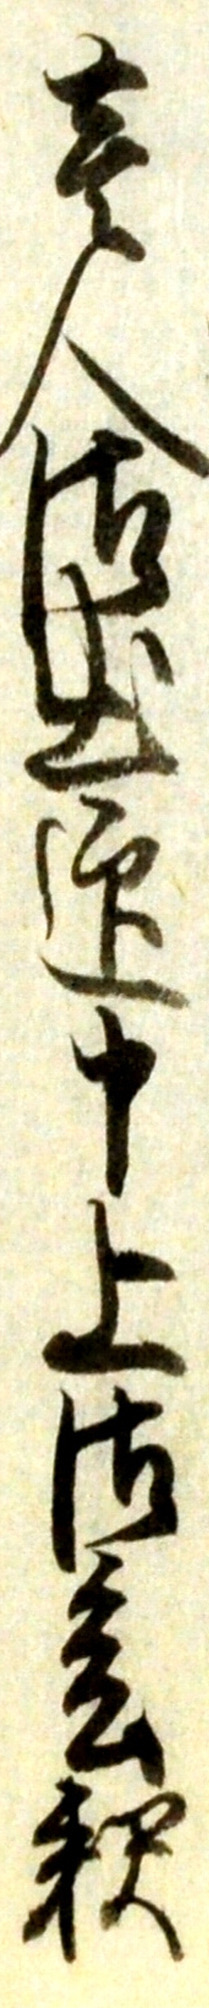壱人御出迎申上御会釈
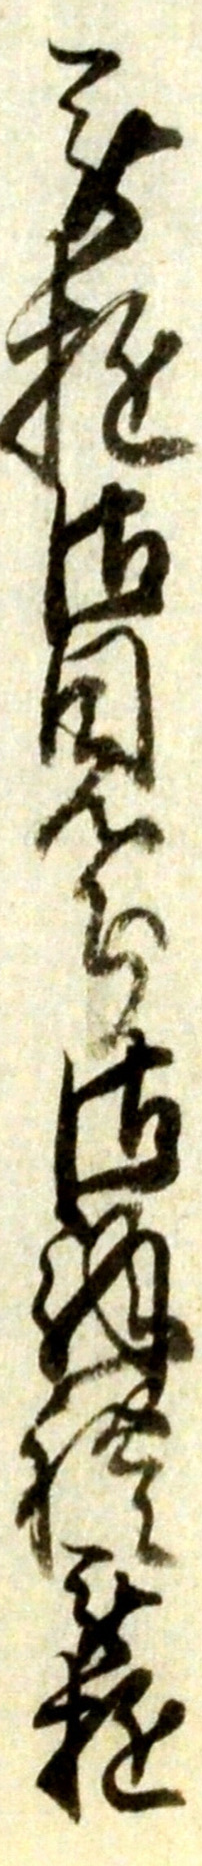被遊御見分御拝礼被遊

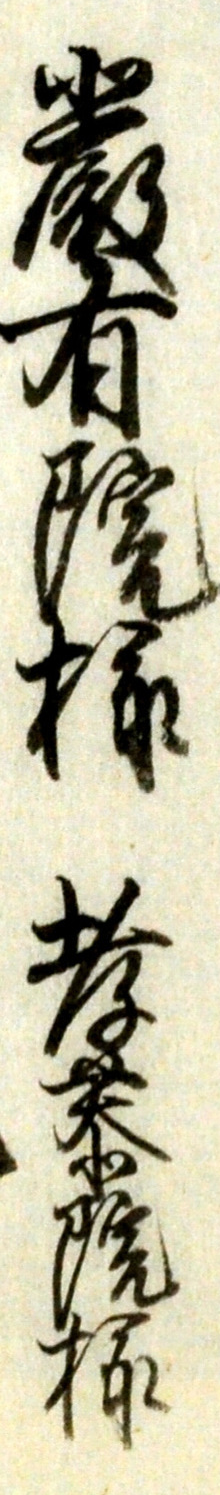厳有院様孝恭院様
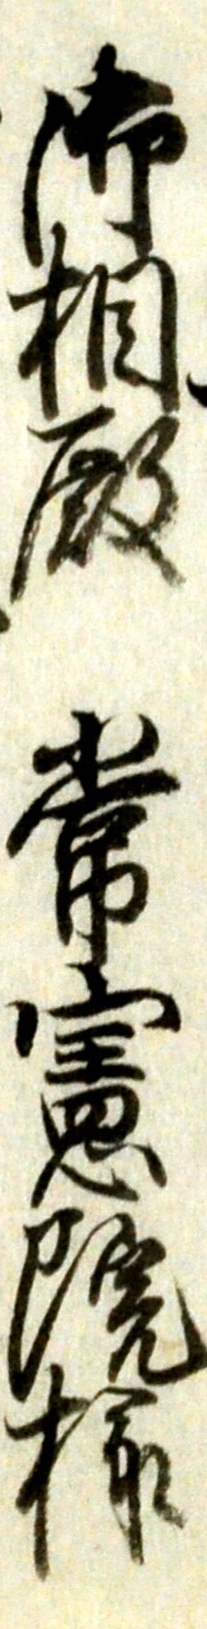御相殿常憲院様
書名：紅葉山御見分ノ節ノ御書付
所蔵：伊那市立高遠町図書館・合同会社AMANE
